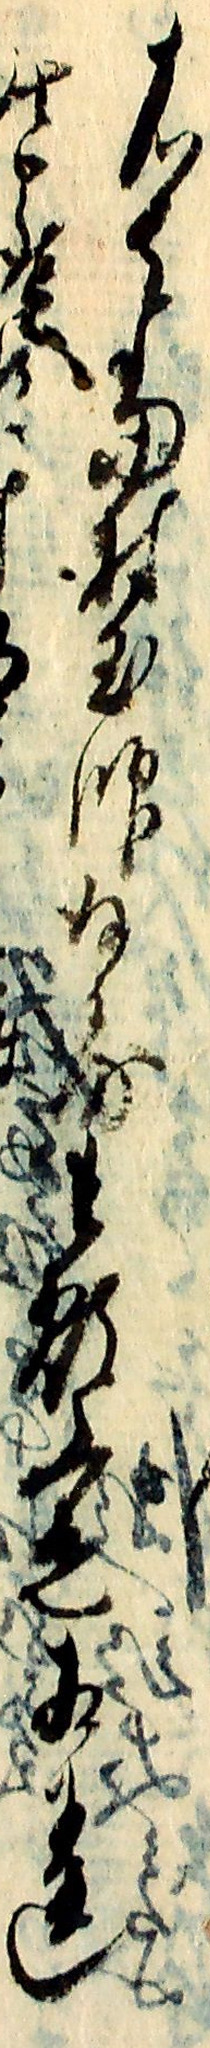右は当村玉師何兵衛奉願上通相違
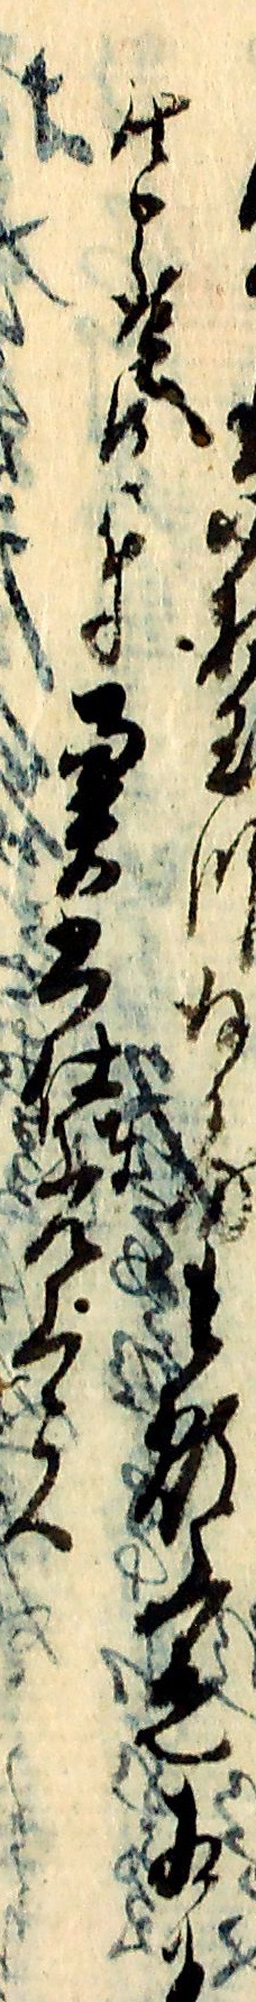無御座候に付奥書仕奉差上候以上
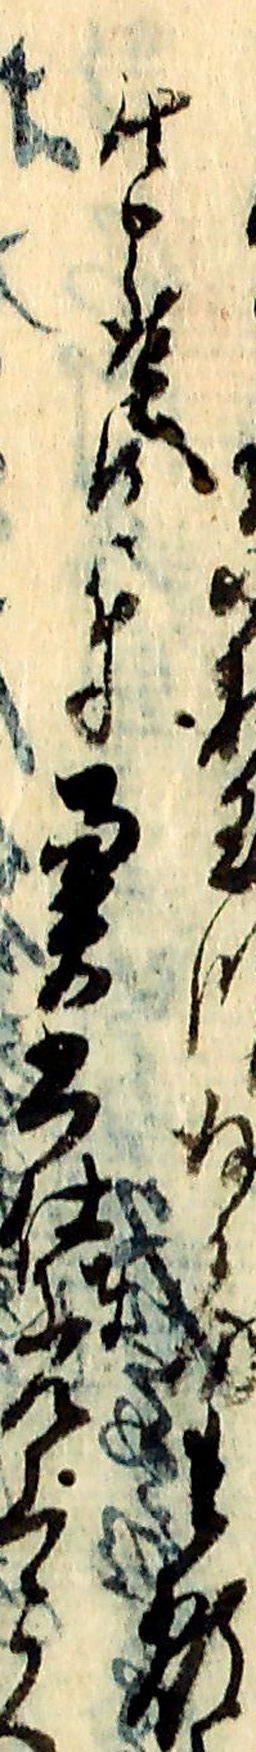無御座候に付奥書仕奉差上候以上
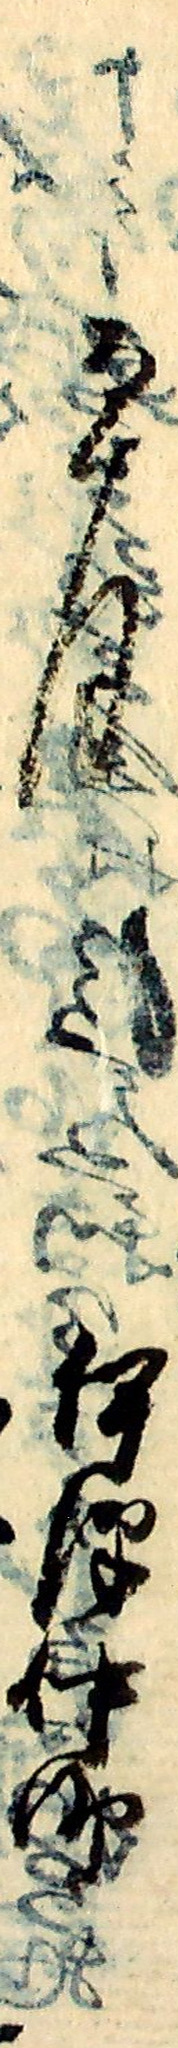酉月伊沢仲助
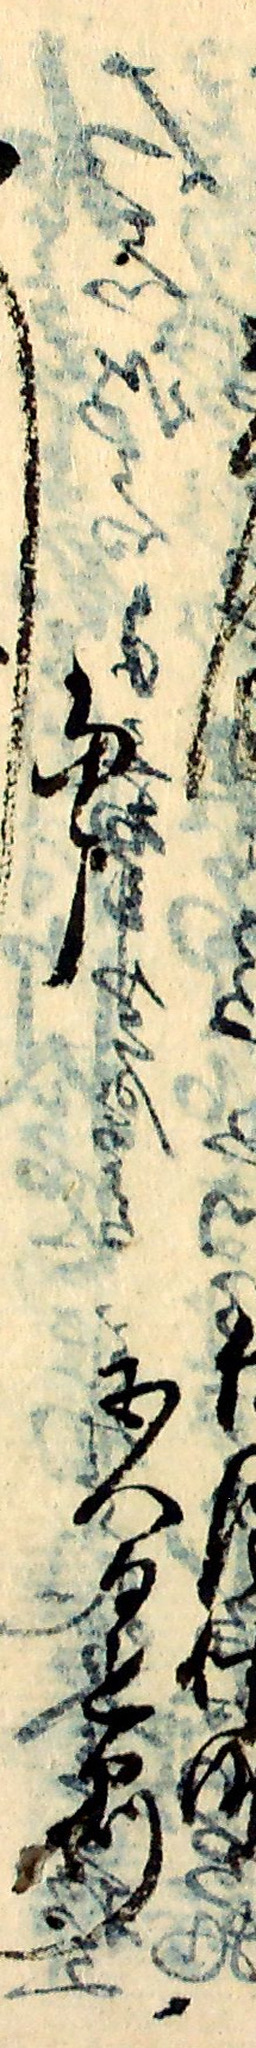五人与連判
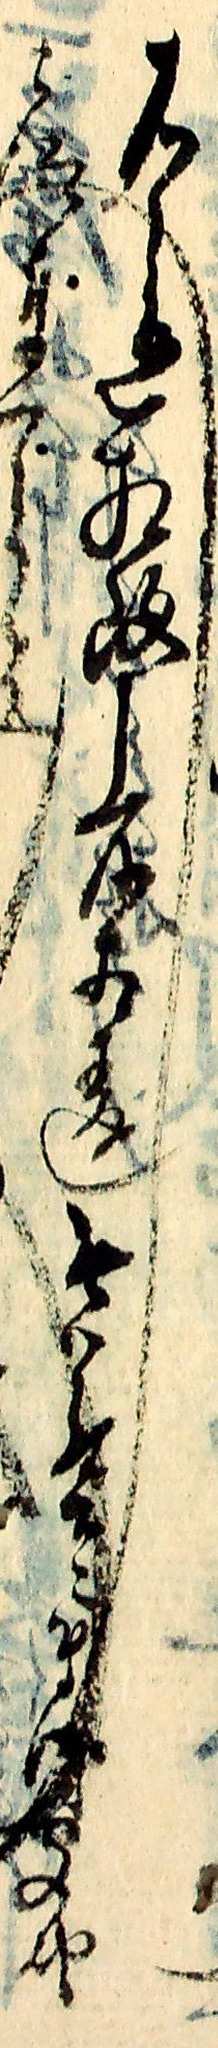右之通相改申上候相違無御座候に付御聞届
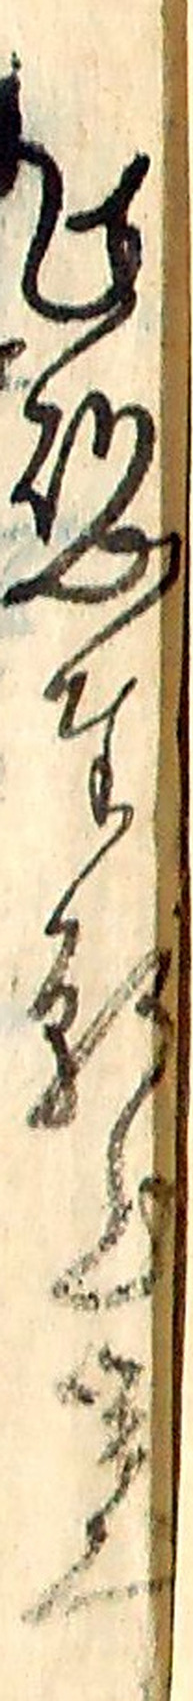乍恐奉願上覚

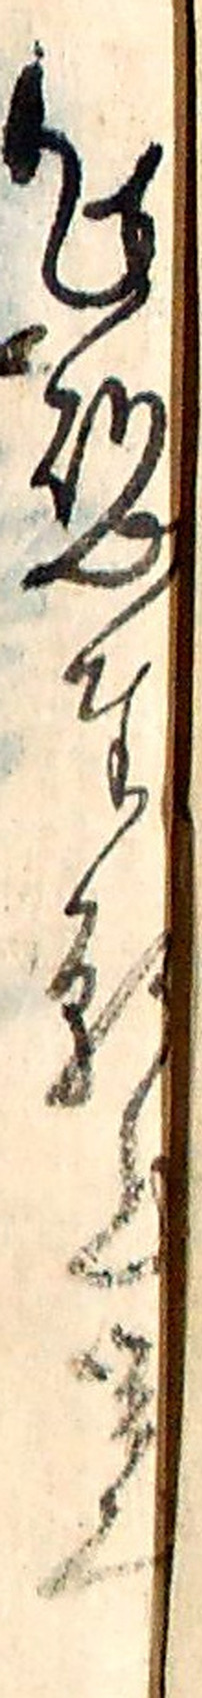乍恐奉願上覚
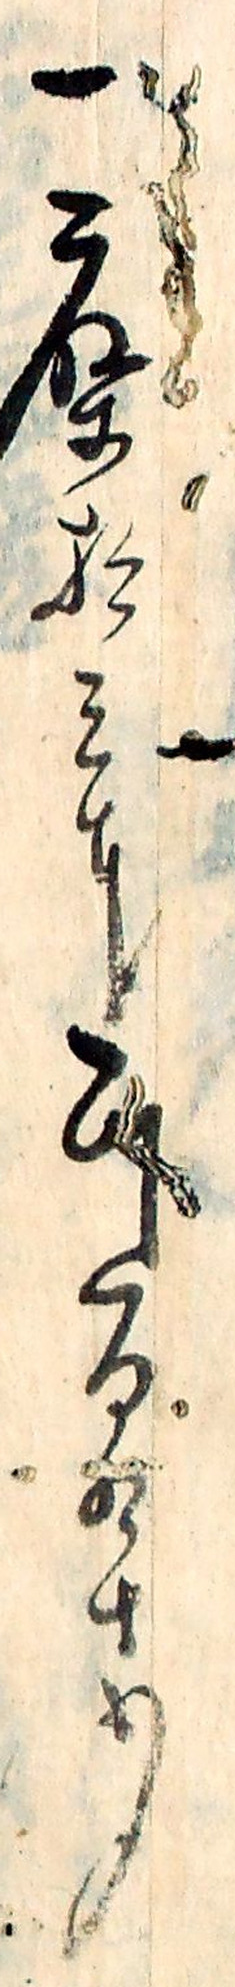一蒅拾三本正百九十五〆
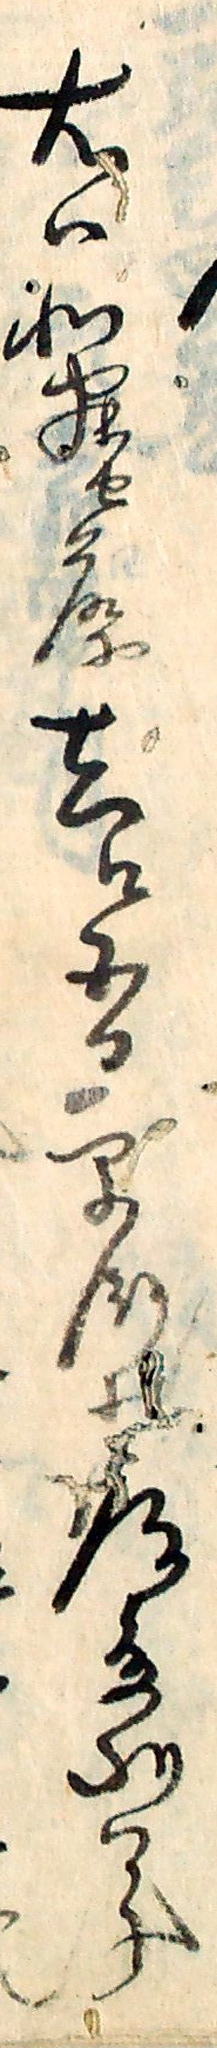右は私寐せ蒅去る五日早淵村後藤利八郎
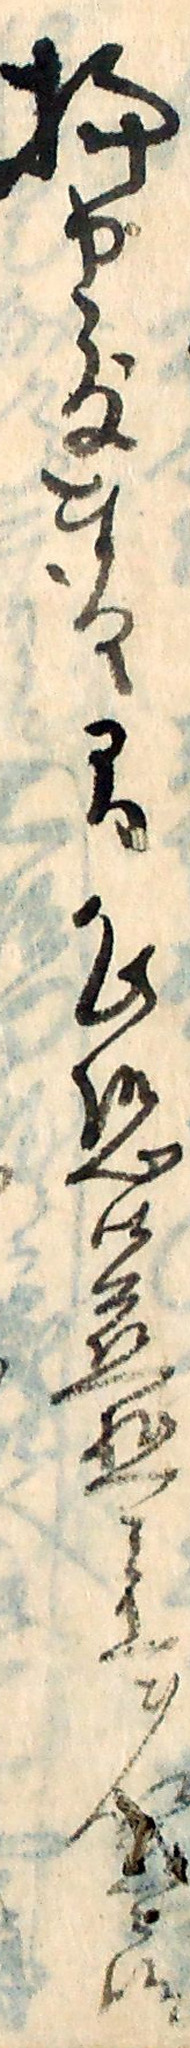揚申度奉存候間乍恐御慈悲之上を以
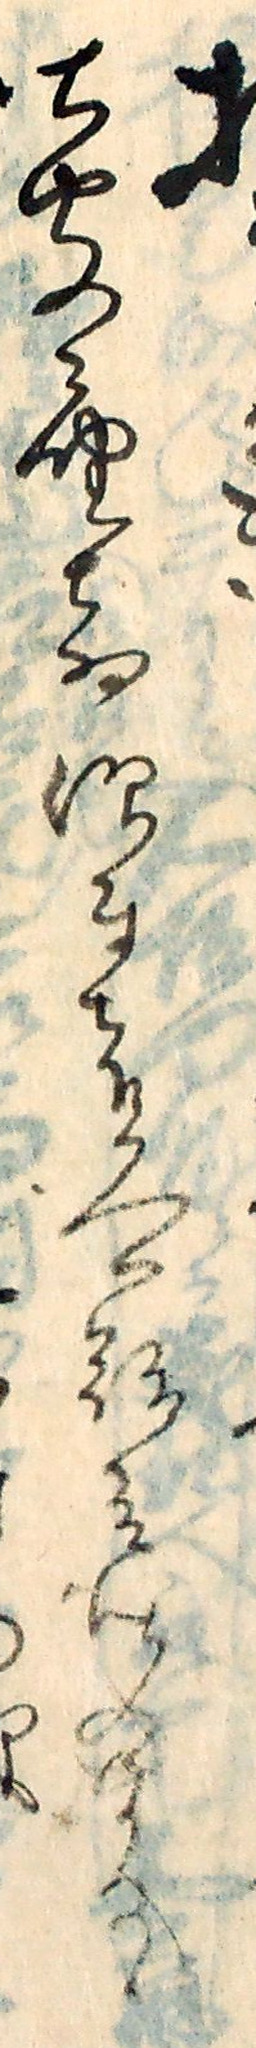御聞届被為仰付被下候へは難有仕合奉存候
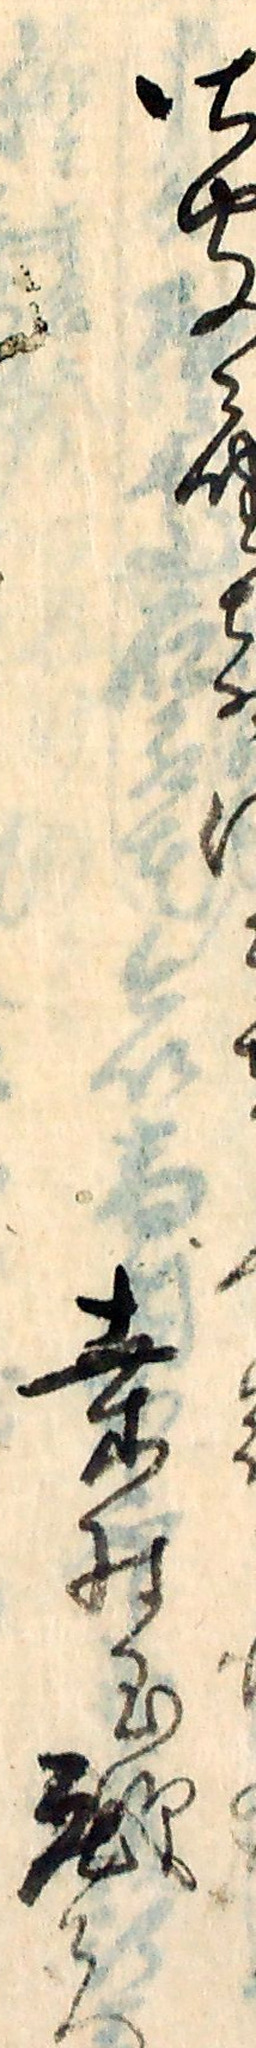桑村玉師
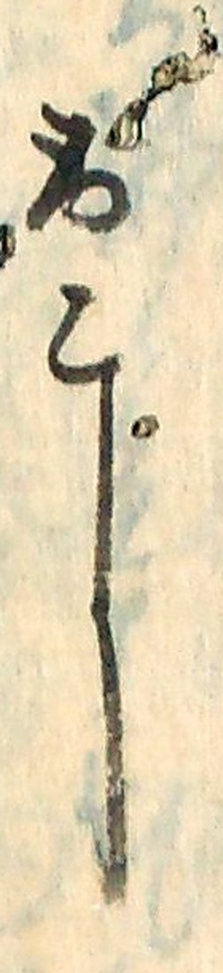酉正月
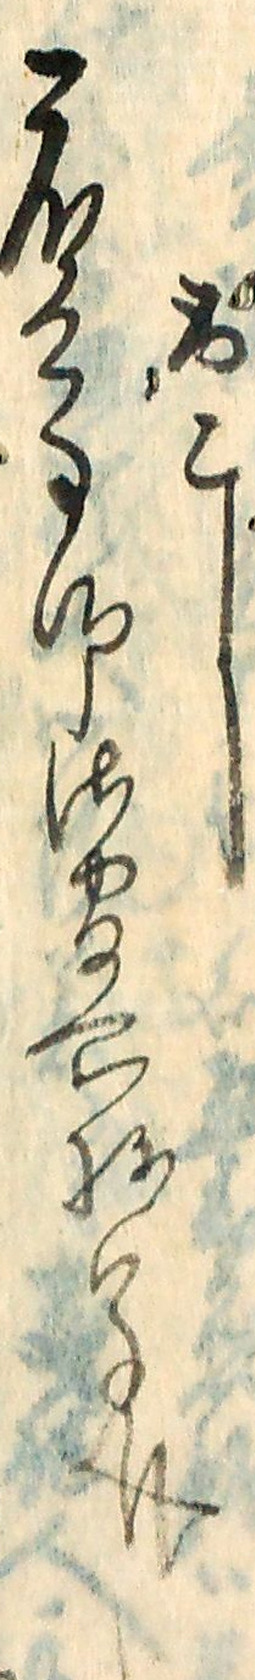藍方御代官所様御手代
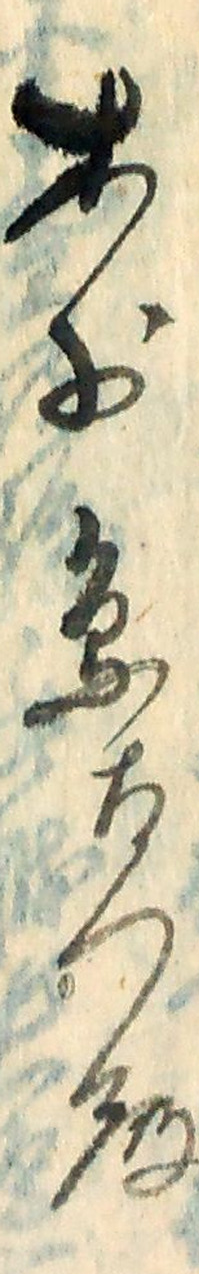木村円左衛門殿
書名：諸御願書控(後藤氏壱番）
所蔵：鳴門教育大学 Naruto University of Education
